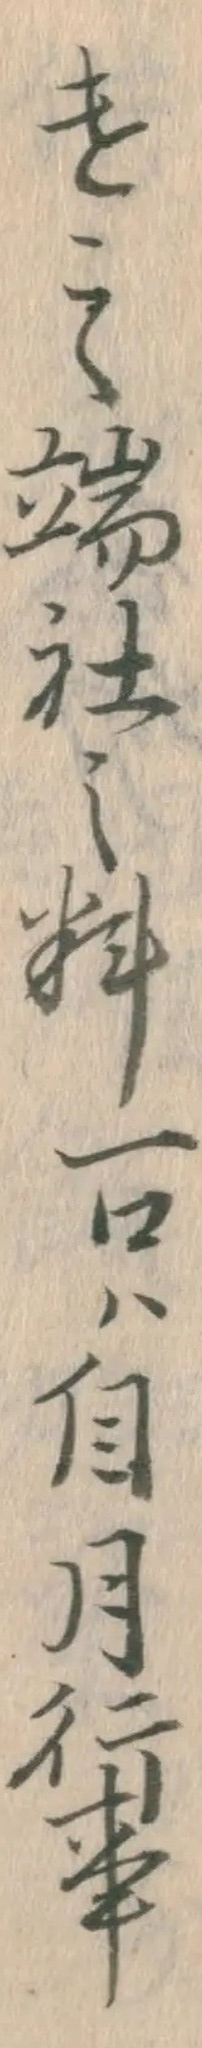遣之端社之料一口ハ自月行事
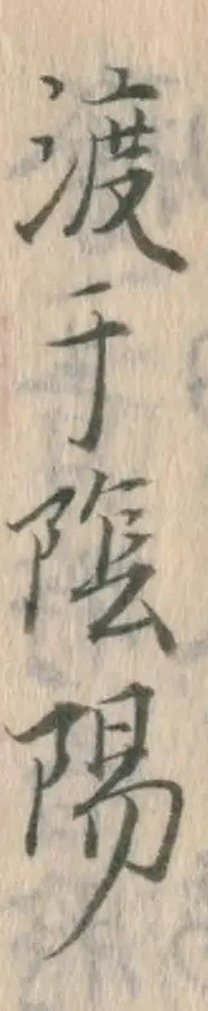渡于陰陽
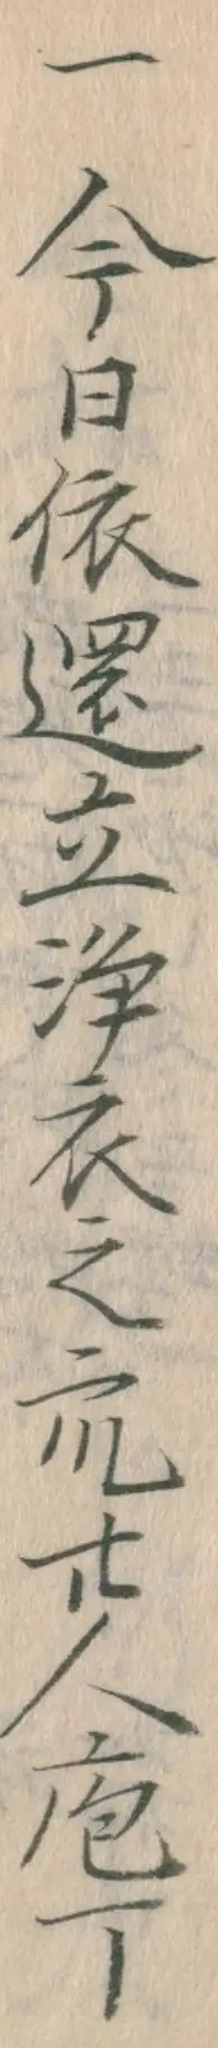一今日依還立浄衣之衆廿人包丁
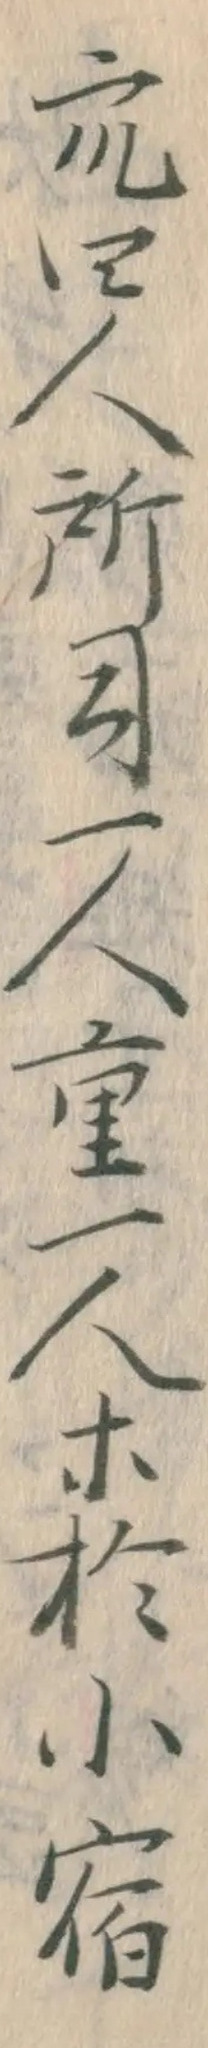衆四人所司一人重一人等於小宿
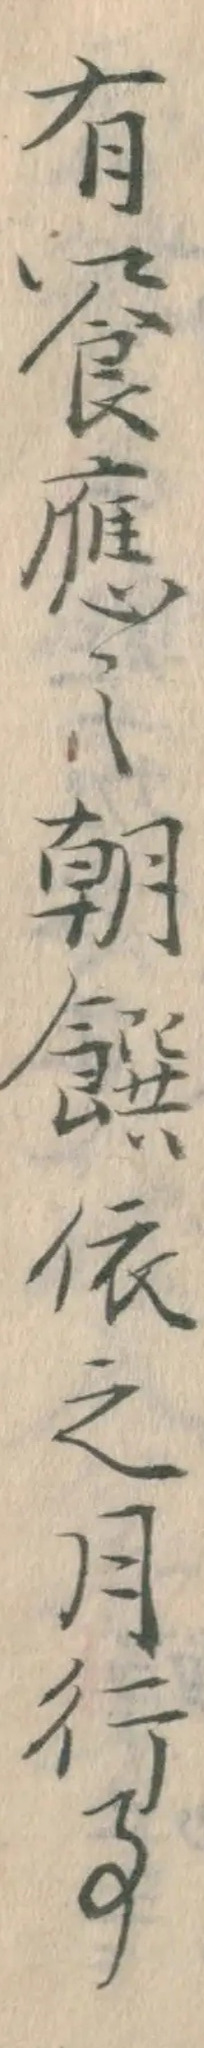有饗応之朝饌依之月行事
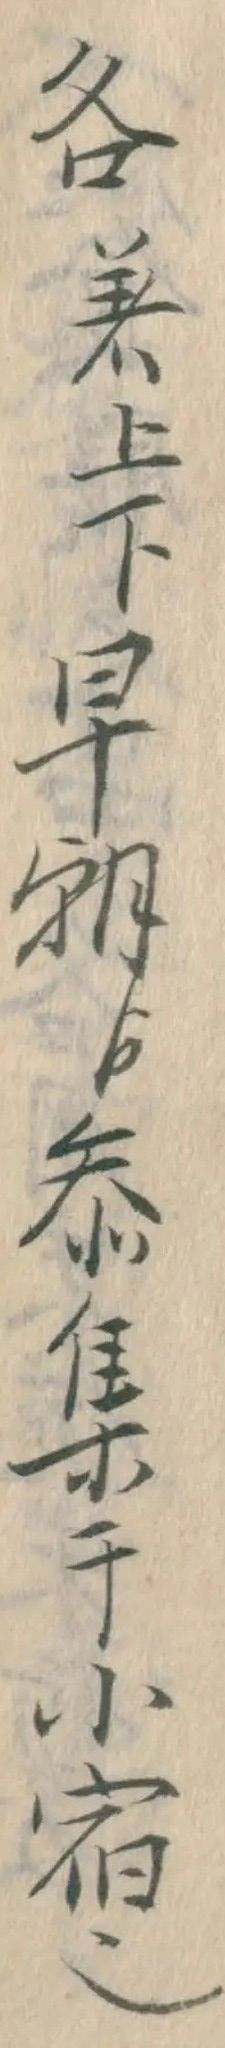各着上下早朝ゟ参集于小宿也

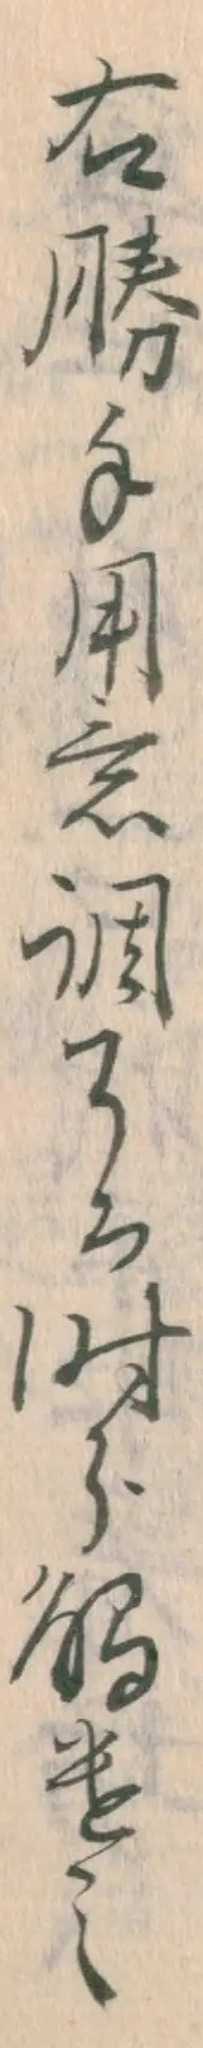右勝手用意調了而時分触遣之
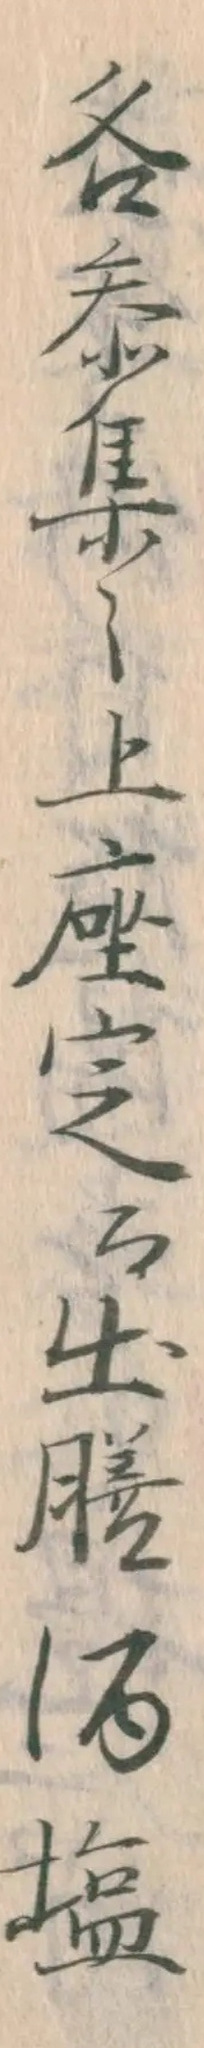各参集之上座定而出膳酒塩
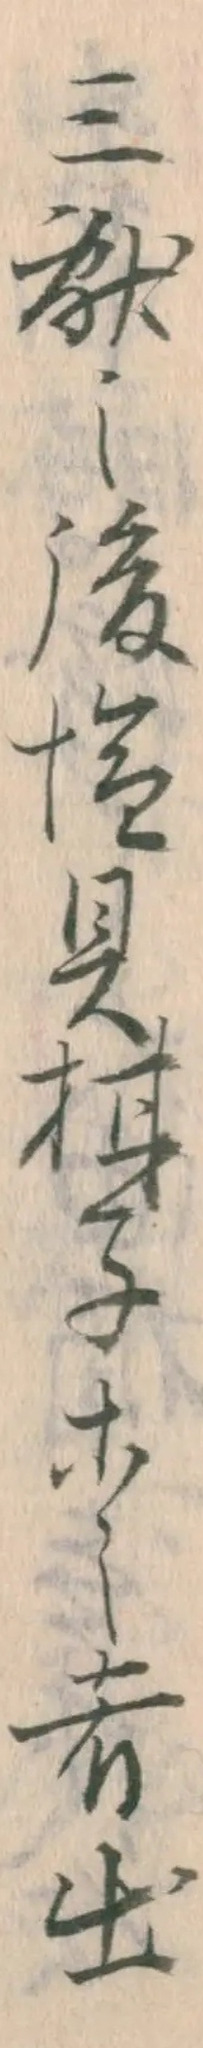三献之後塩貝柑子等之肴出
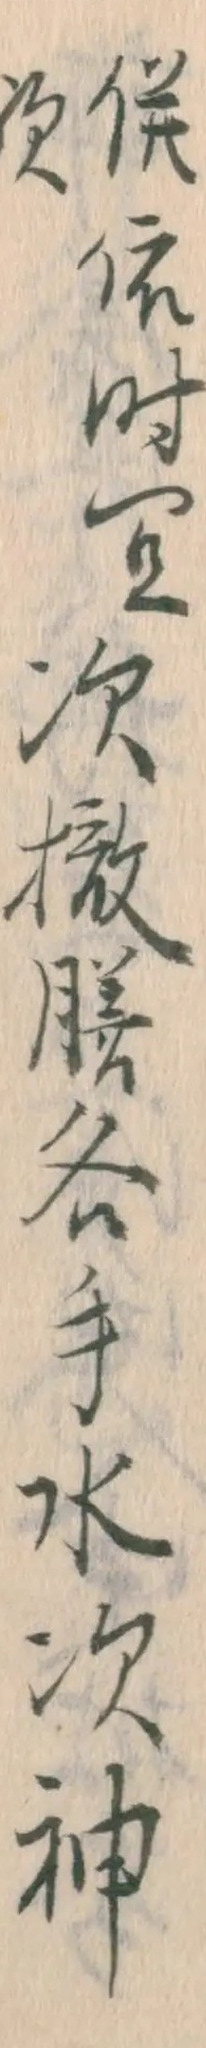併依時宜歟次撤膳各手水次神
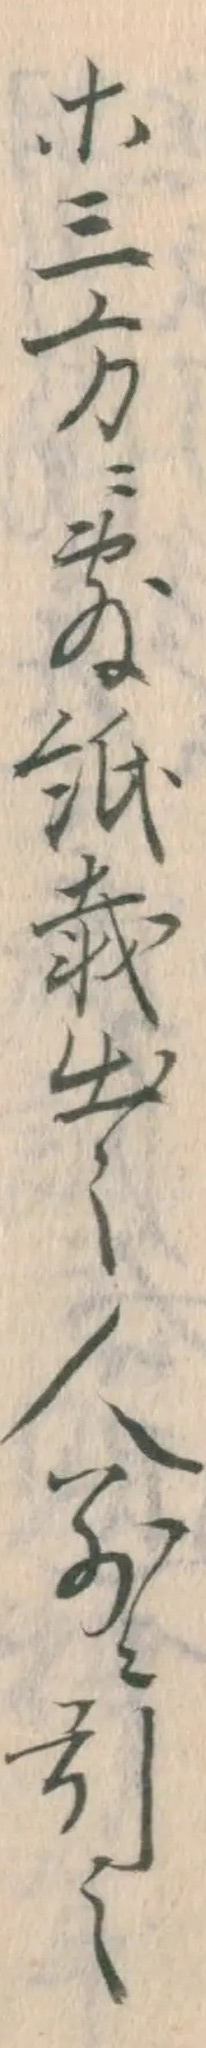等三方に敷紙載出之人別に引之
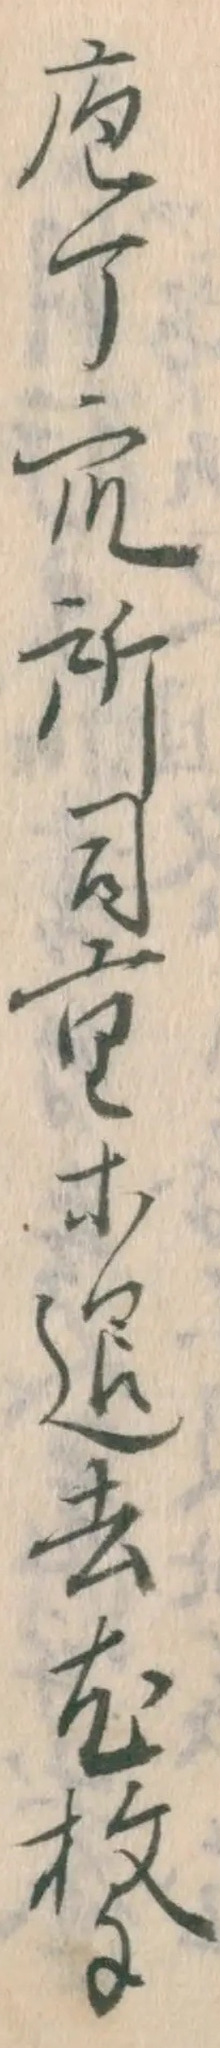庖丁衆所司重等退去尤枚手
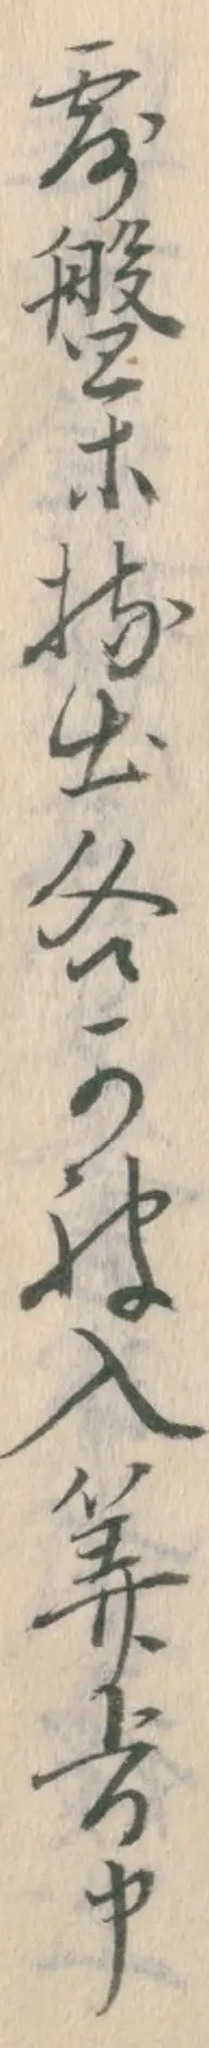露盤等持出各可被入算旨申
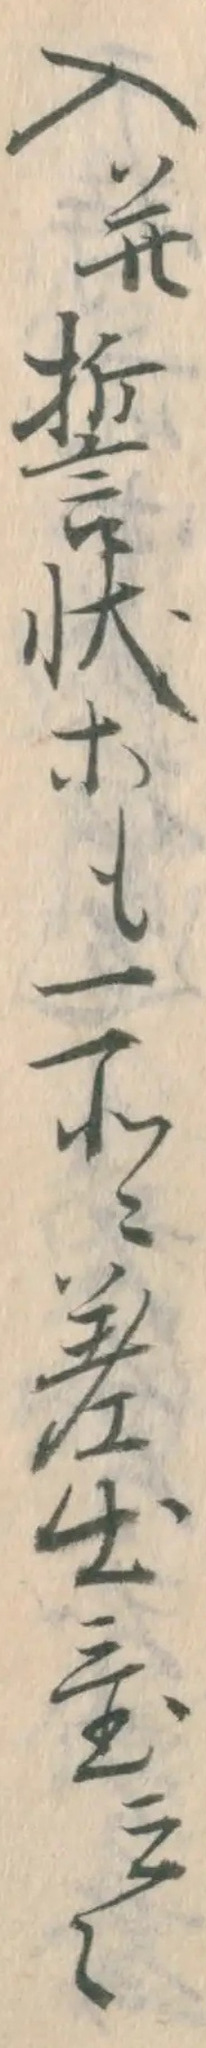入并誓状等も一所に差出置云々

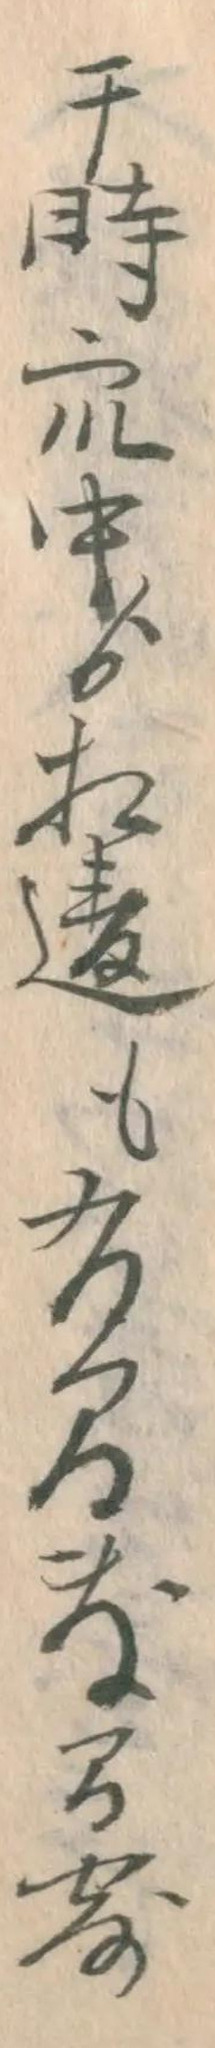于時衆中ゟ相違も有間敷間寄
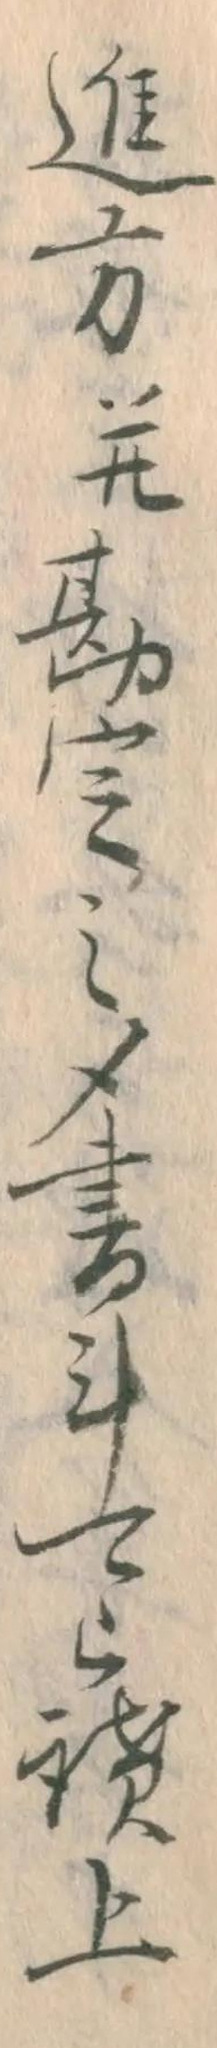進方并勘定之〆書斗可被読上
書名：賀茂社記録. 第81冊
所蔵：国立国会図書館 National Diet Library, JAPAN
